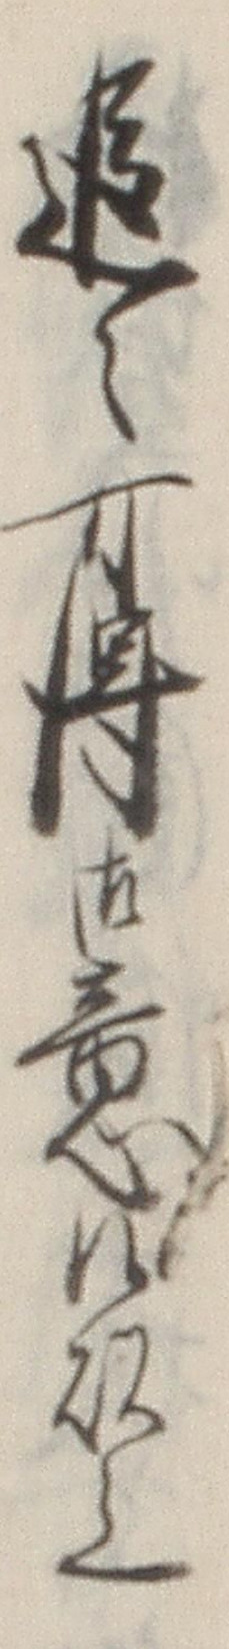追々可得御意候以上
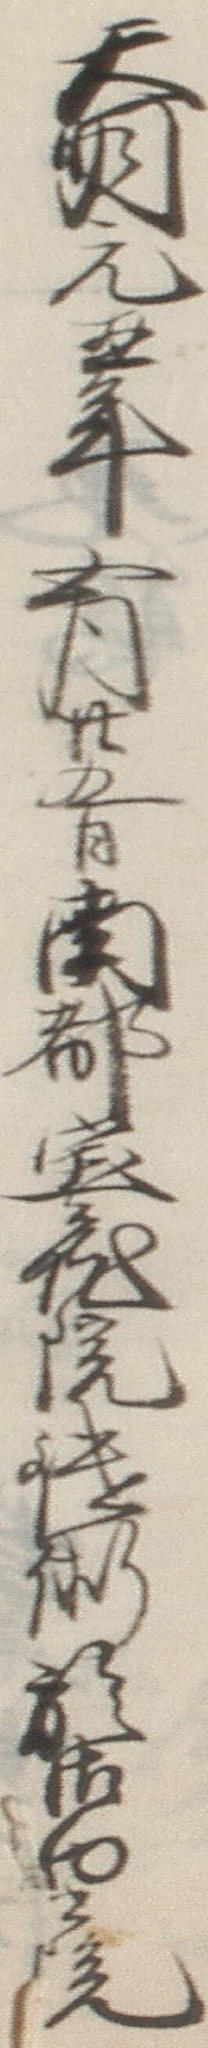天明元丑年五月廿九日南都宝蔵院鑓術於御白書院
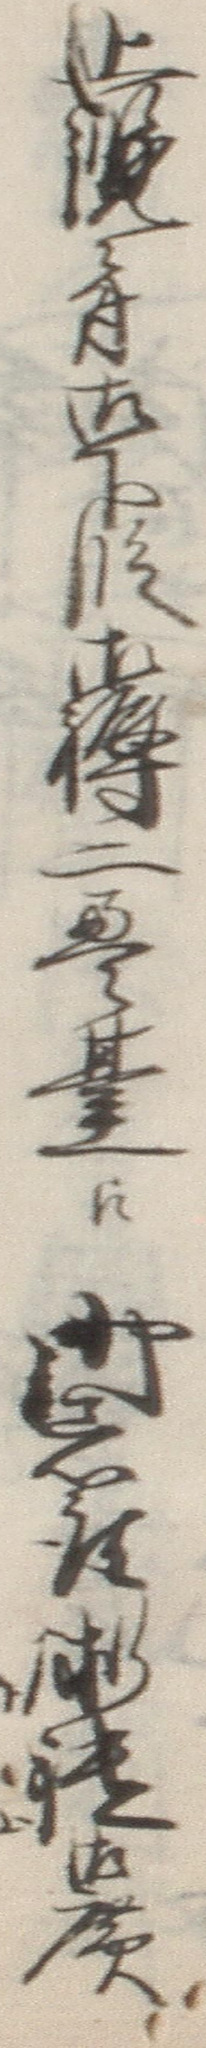上覧ニ付御下段御褥二畳台え御着座術鑓御広
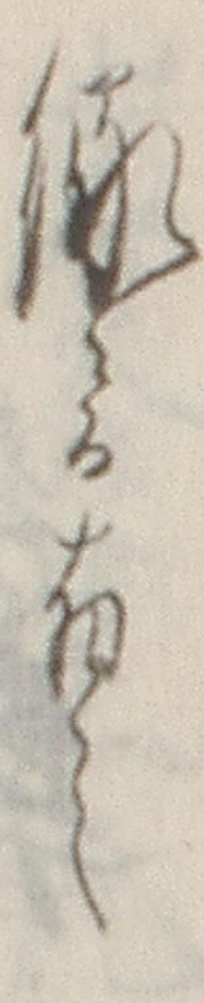縁ニ而有之
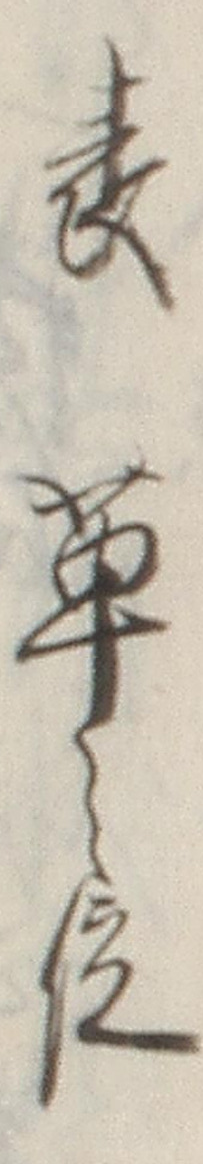表草之位
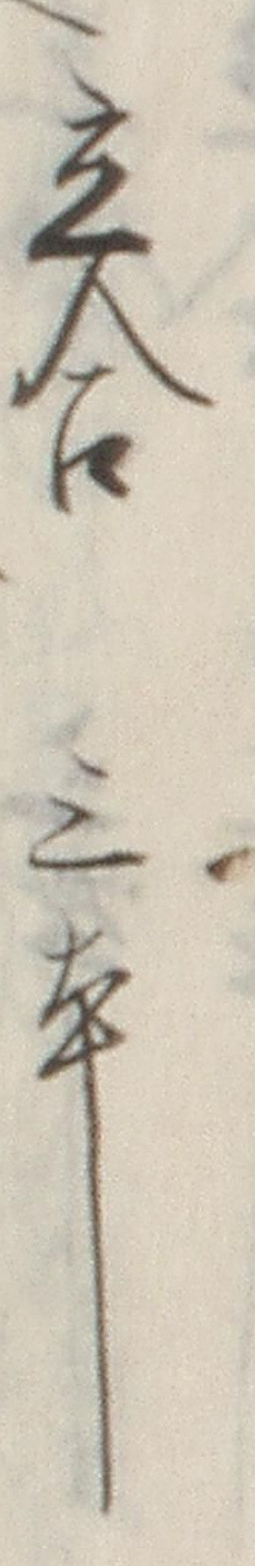立合三本
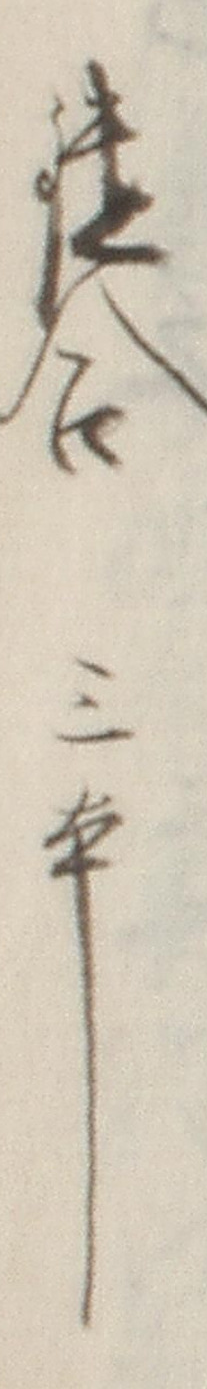立合三本
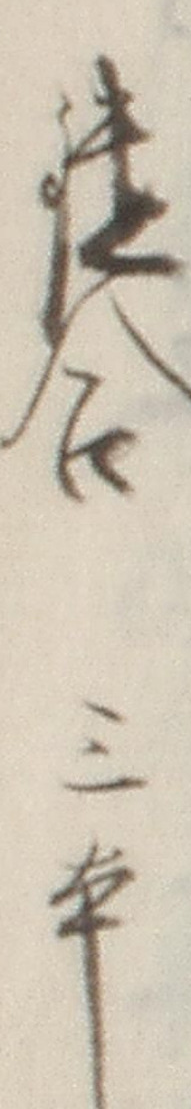立合三本

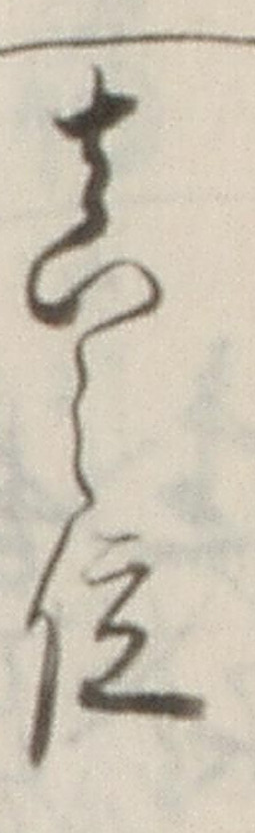真の位
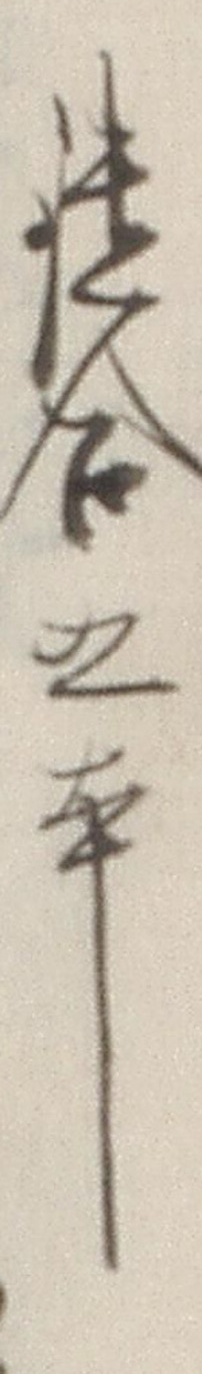鑓合三本
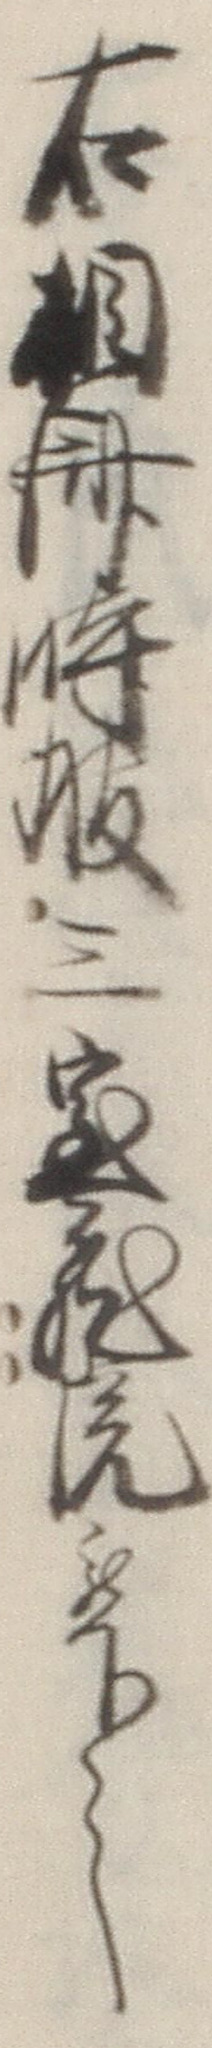右相済時服三宝蔵院被下之
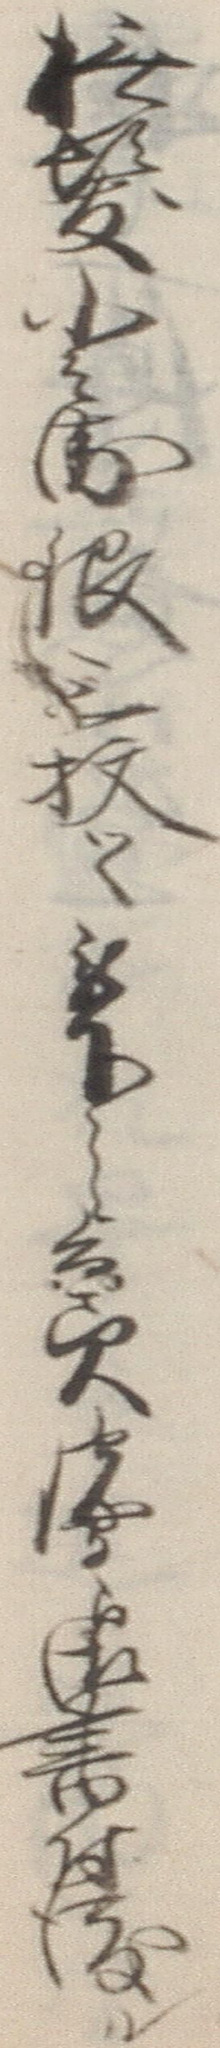撫髪小兵衛銀三枚ツヽ被下之旨美濃守え御書付渡ル
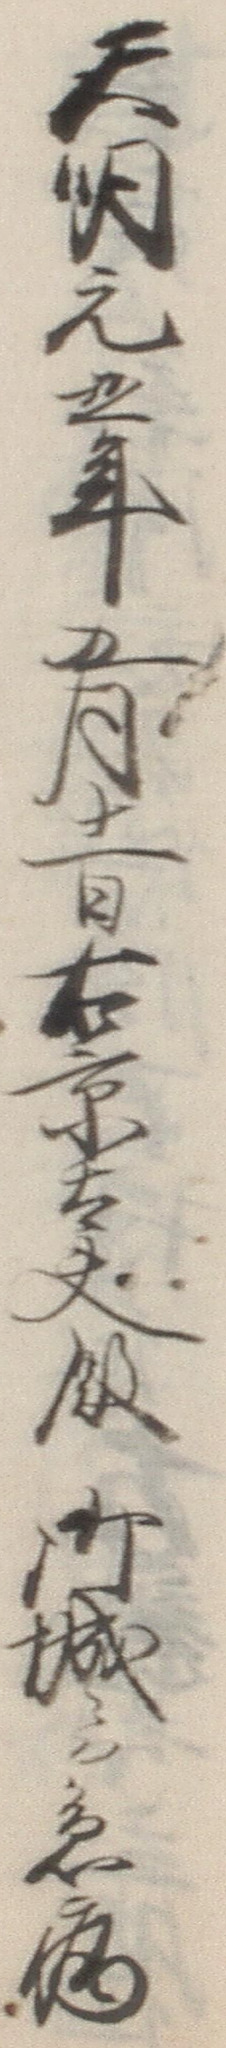天明元丑年九月十一日右京太夫殿御城ニ而急病
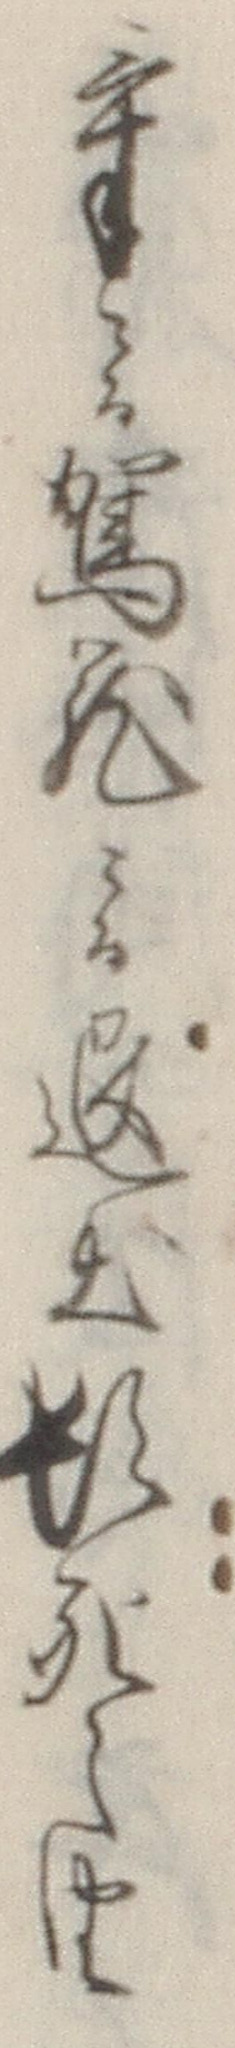気ニ而駕籠ニ而退出頓死之由
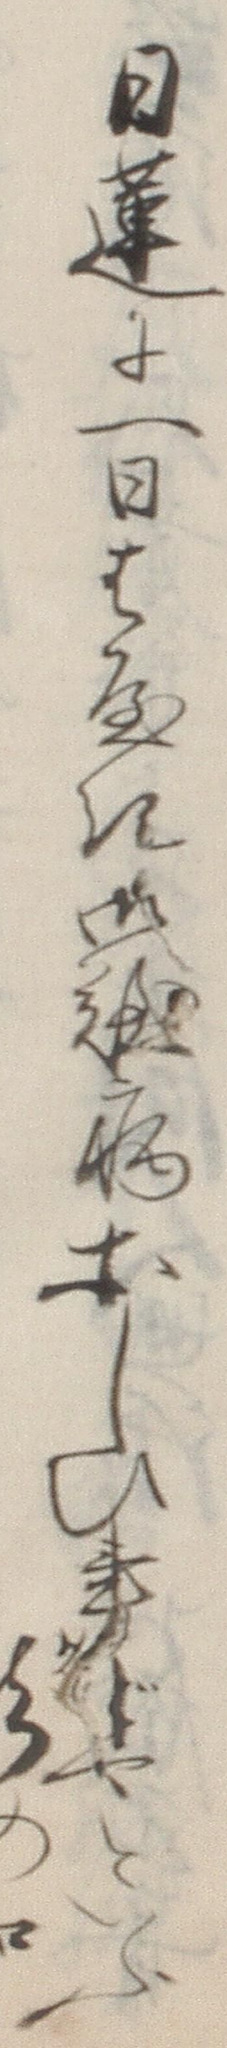日蓮に一日はやき御難病おしい事じゃといふ
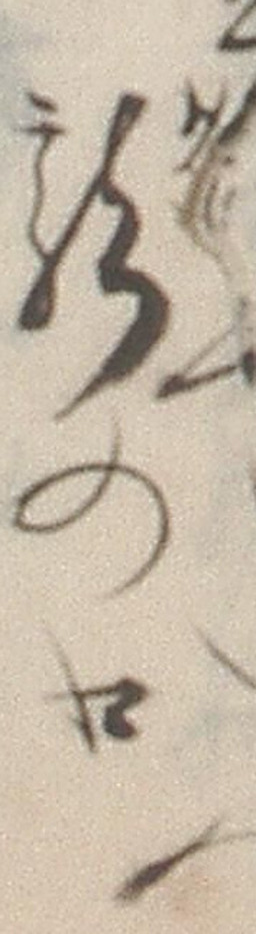影の口
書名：[諸国災害記録]
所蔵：東京大学地震研究所図書室 Earthquake Research Institute Library, The University of Tokyo, JAPAN
